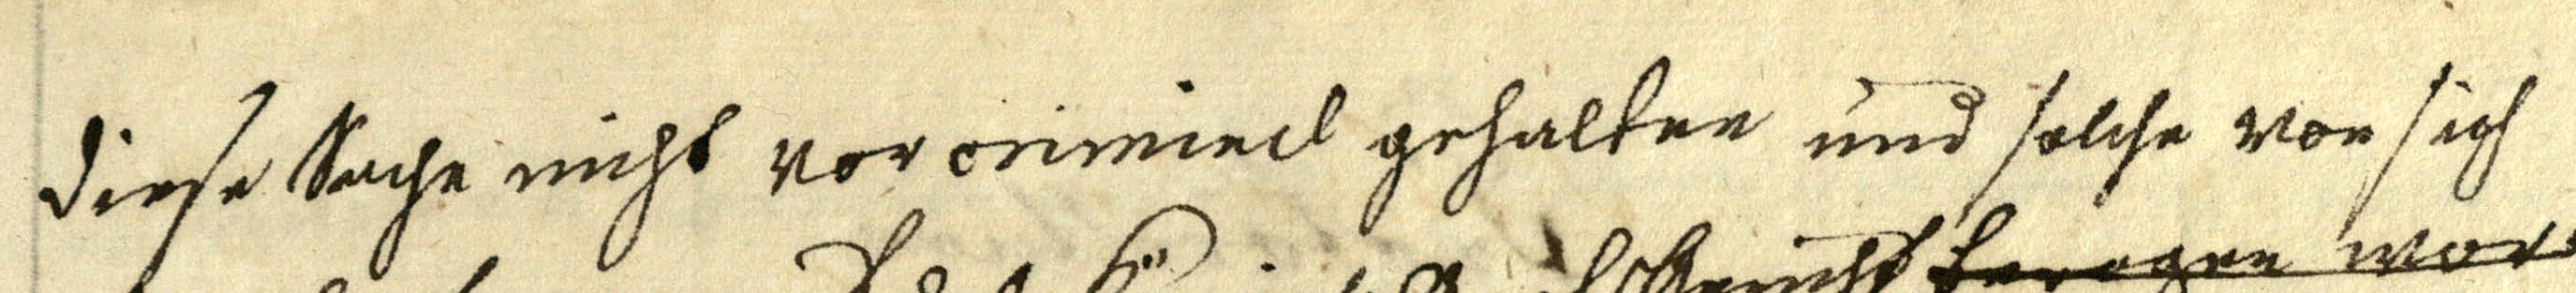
diese Sache nicht vor criminel gehalten und solche von sich
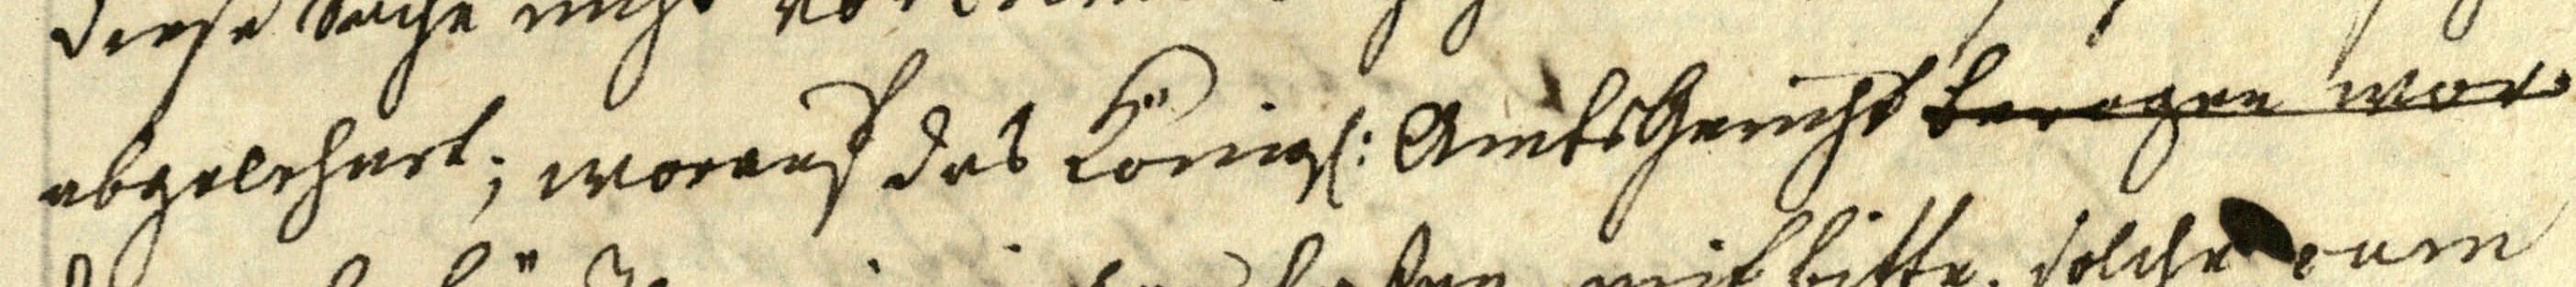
abgelehnet; worauf des Königl. Amtsgericht
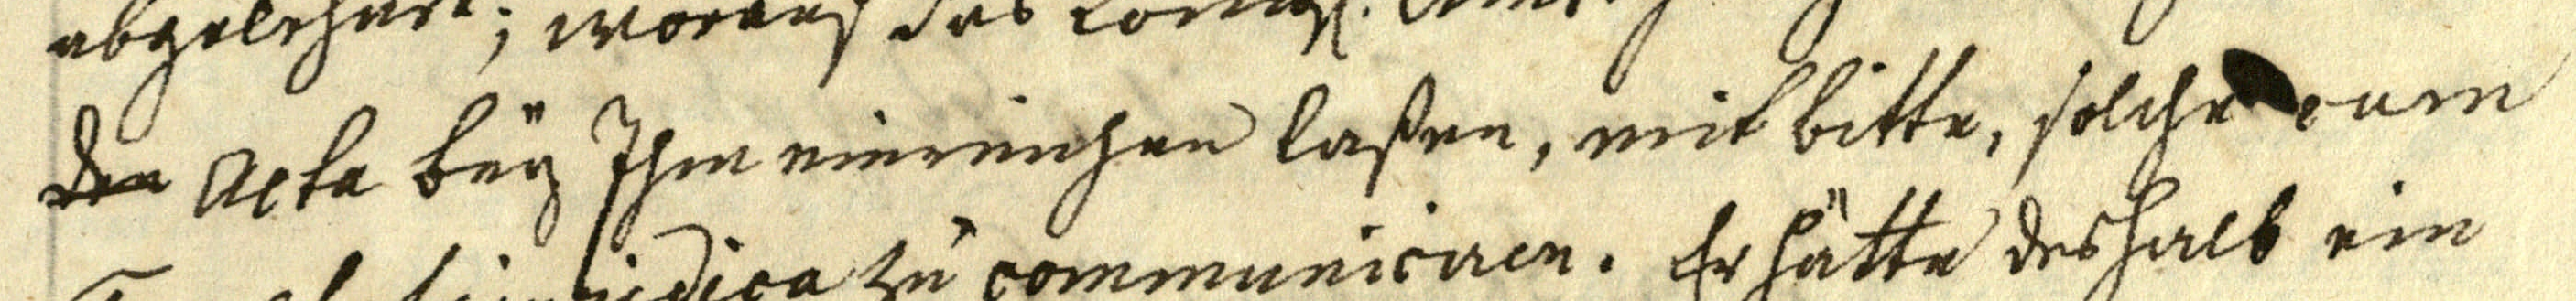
Acta beÿ Ihm einreichen laßen, mit Bitte, solche cum
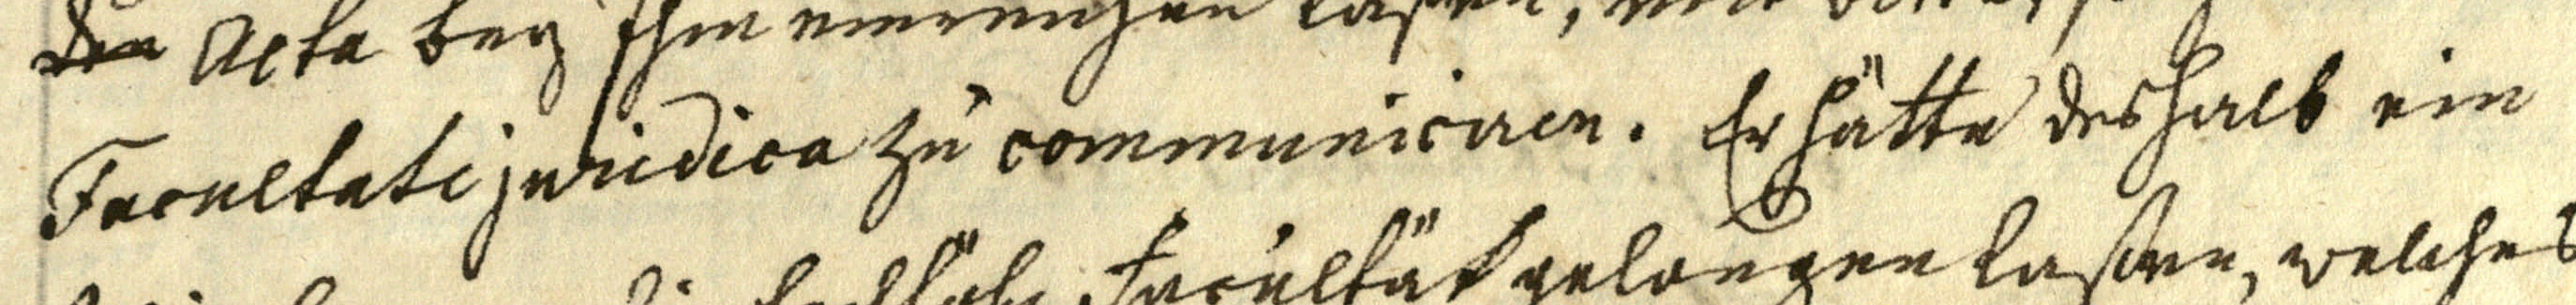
Facultati juridica zu communiciren. Er hätte deshalb ein
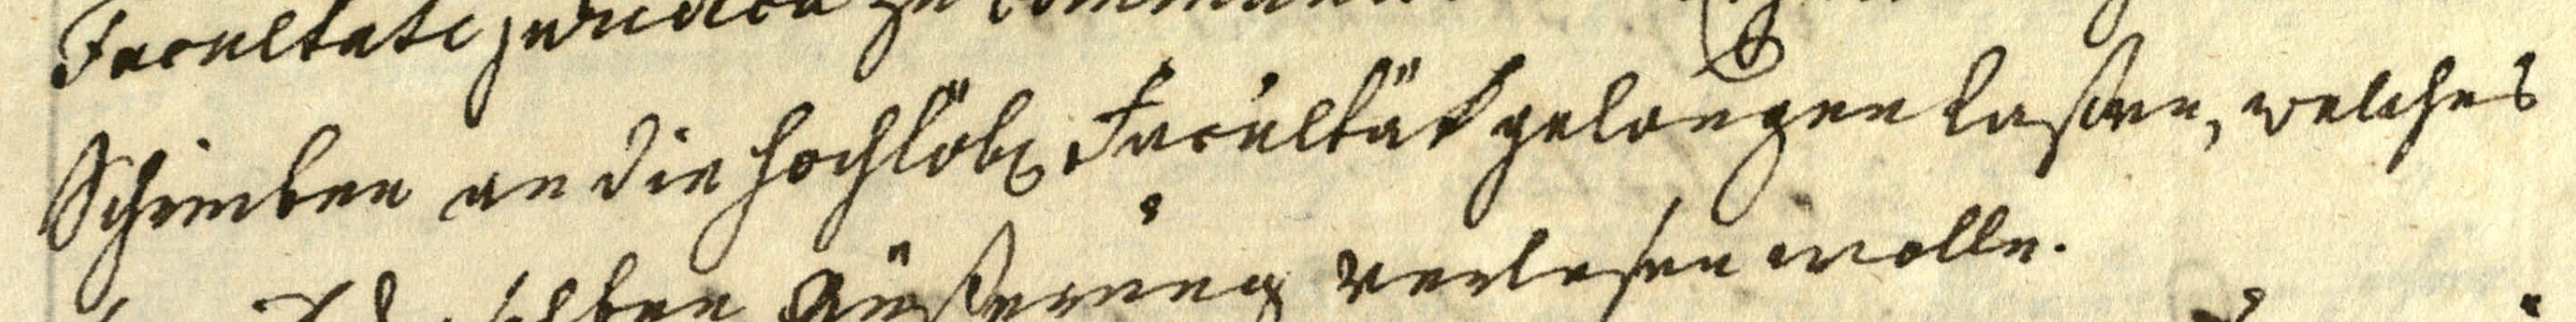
Schreiben an die hochlöbl. Facultät gelangen laßen, welches
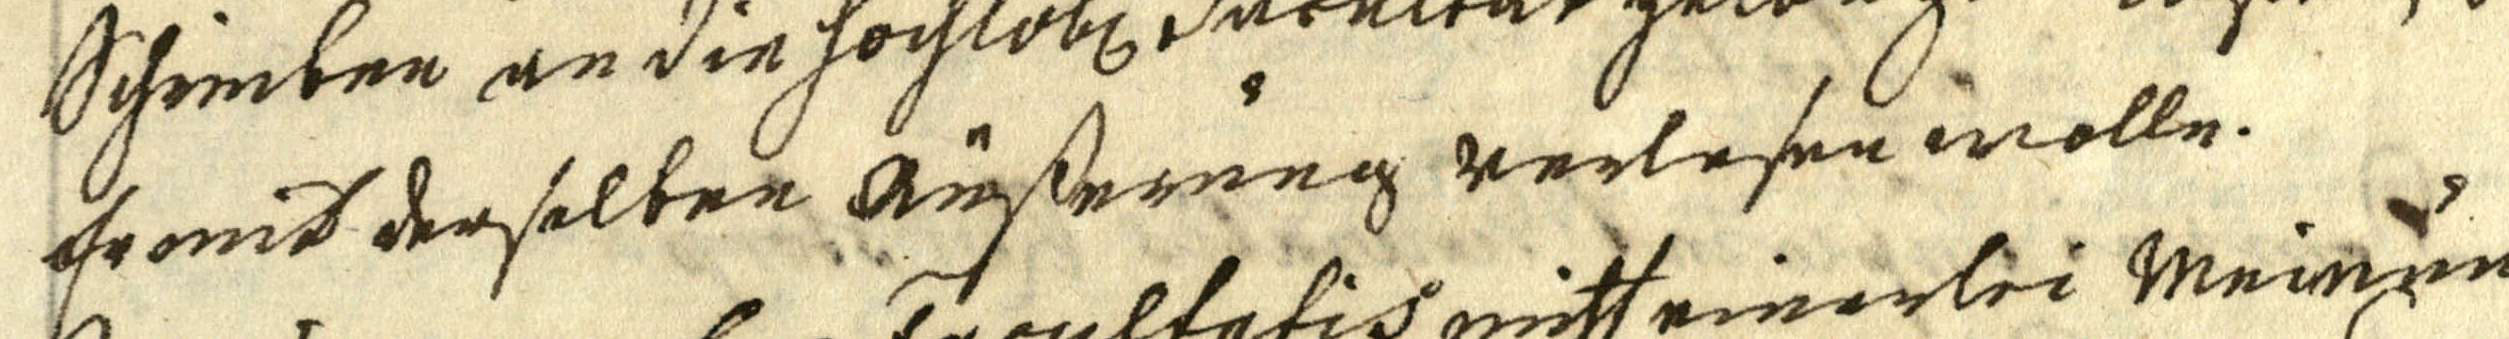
Er mit derselben Äußerung verlesen wolle.
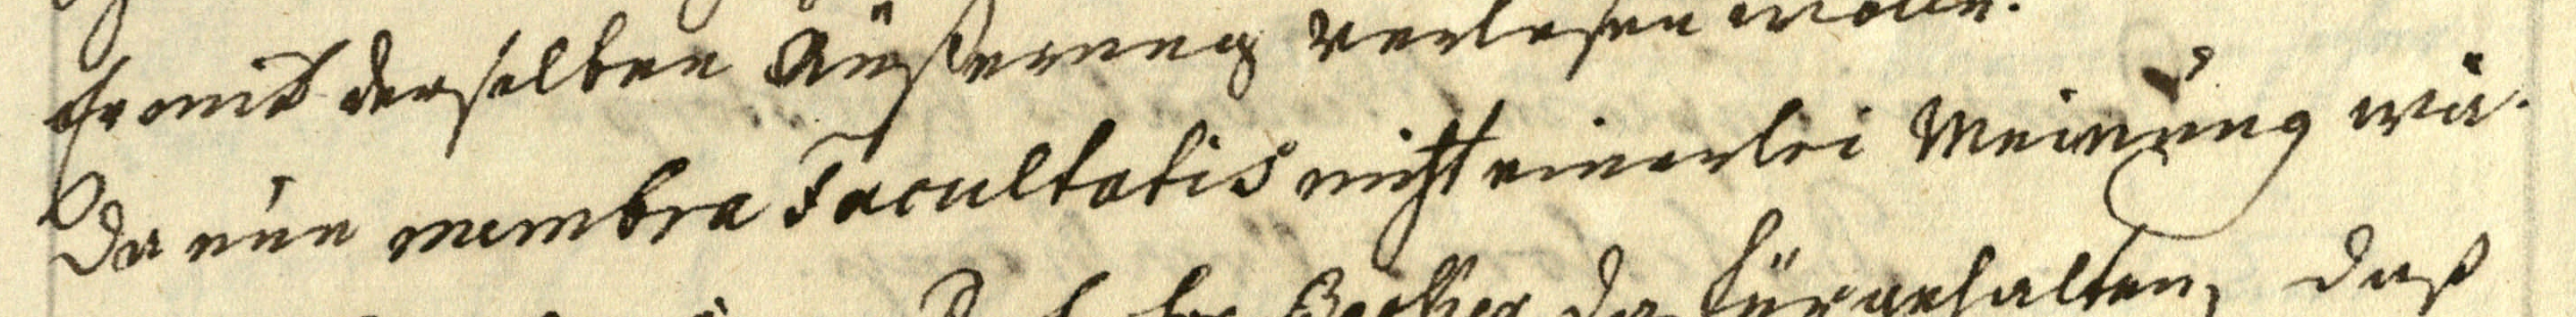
da nun membra Facultatis nicht einerlei Meinung wä¬
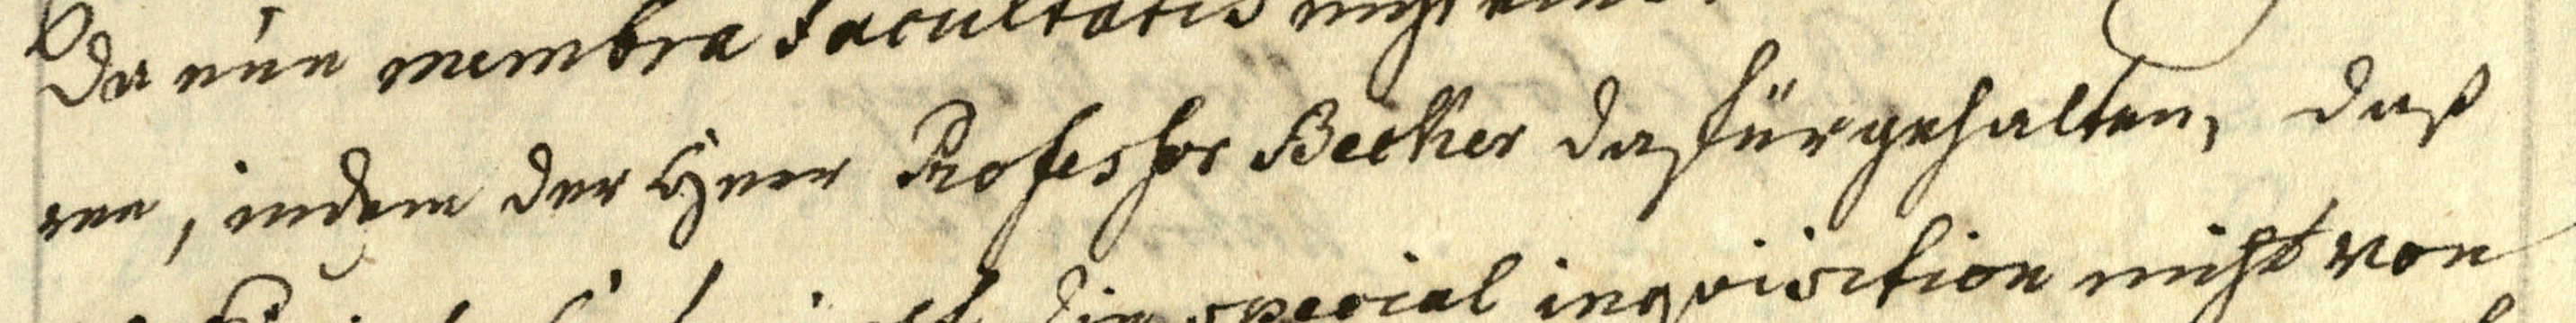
ren, indem der Herr Professor Becker dafür gehalten, daß
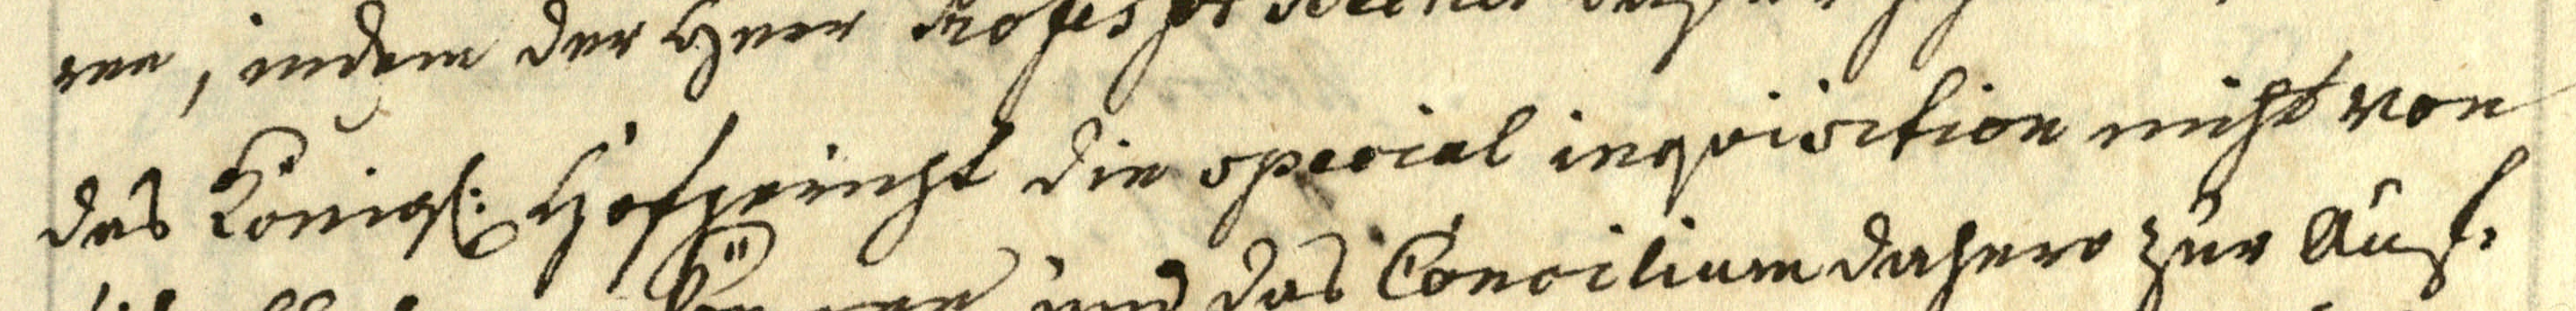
das Königl. Hofgericht die spcial inquisition nicht von
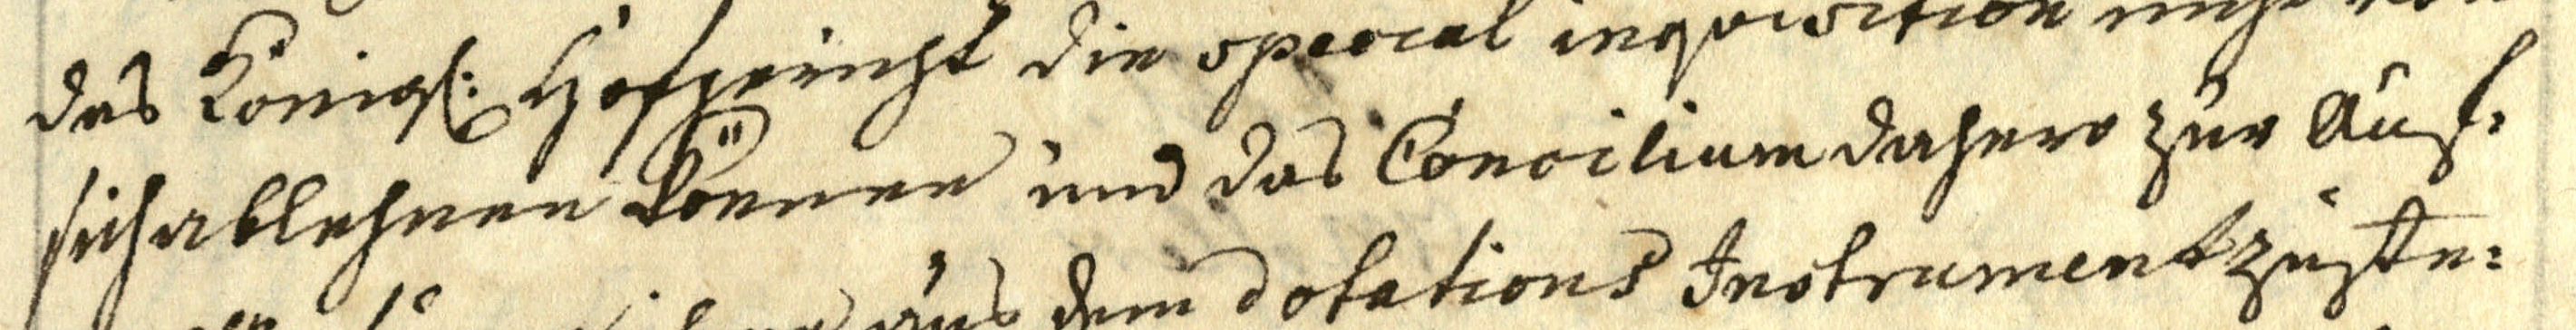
sich ablehnen können und das Concilium dahero zur Auf¬
